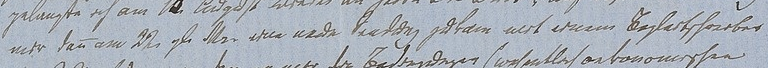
mir dann am 22. gl. Ms. eine neue Sendung zukam mit einem Begleitschreiben
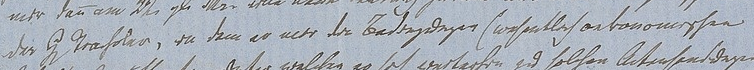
des Hrn Trachsler, in dem er mir die Bedingungen (wesentlich oekonomischen
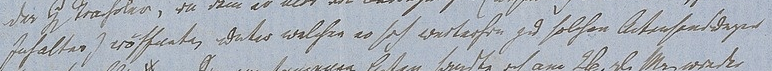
Inhaltes) eröffnete, unter welchen er sich weiterhin zu solchen Actensendungen
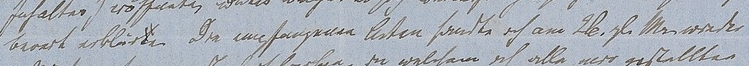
bereit erkläre. Die empfangenen Acten sandte ich am 26. gl. Ms. wieder
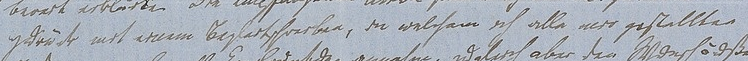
zurück mit einem Begleitschreiben, in welchem ich alle mir gestellten
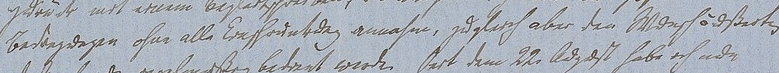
Bedingungen ohne alle Einschränkung annahm, zugleich aber den Wunsch äußerte,
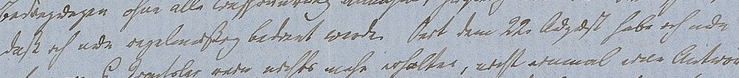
daß ich nun regelmäßig bedient werde. Seit dem 22. August habe ich nun
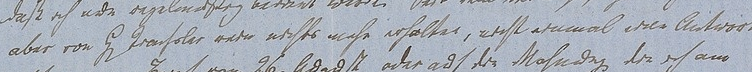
aber von Hrn Trachsler rein nichts mehr erhalten, nicht einmal eine Antwort
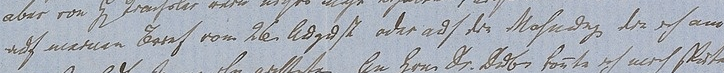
auf meinen Brief vom 26. August oder auf die Mahnung, die ich am
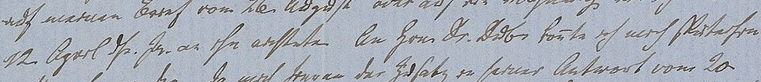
12. April dss. J. an ihn richtete. An Hrn. Dr. Dubs konnte ich mich späterhin
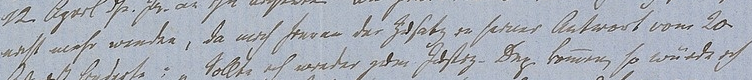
nicht mehr wenden, da mich ferner der Zusatz in seiner Antwort vom 20.
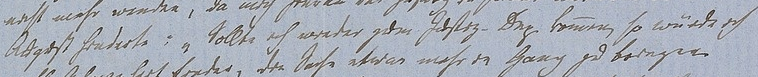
August hinderte: «Sollte ich wieder zum Justiz-Dep. kommen, so würde ich
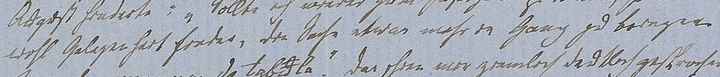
wohl Gelegenheit finden, die Sache etwas mehr in Gang zu bringen.
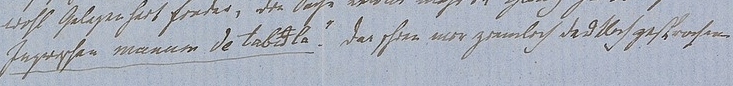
Inzwischen manum de tabula.» Das schien mir ziemlich deutlich gesprochen.
